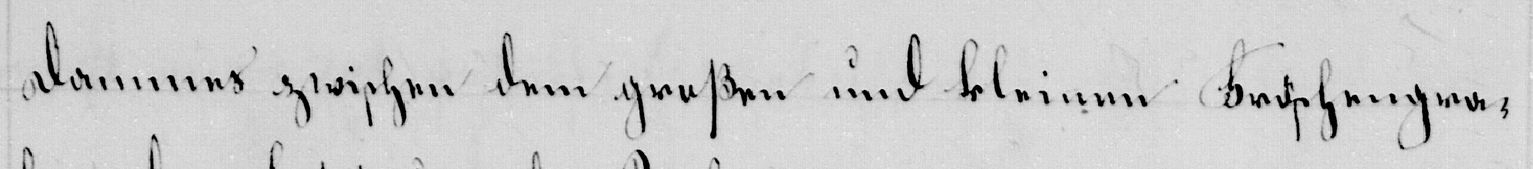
Dammes zwischen dem großen und kleinen Fröschengra¬
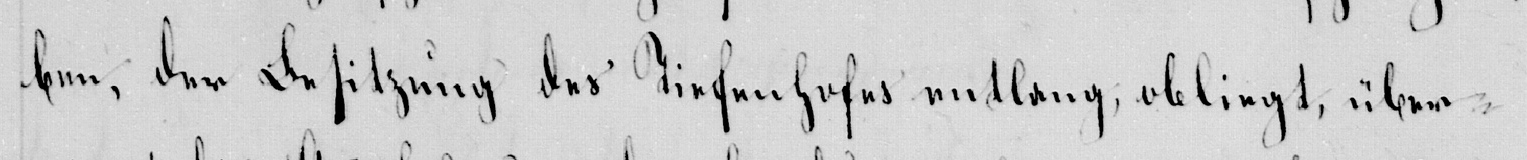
ben, der Besitzung des Tiefenhofes entlang obliegt, über¬
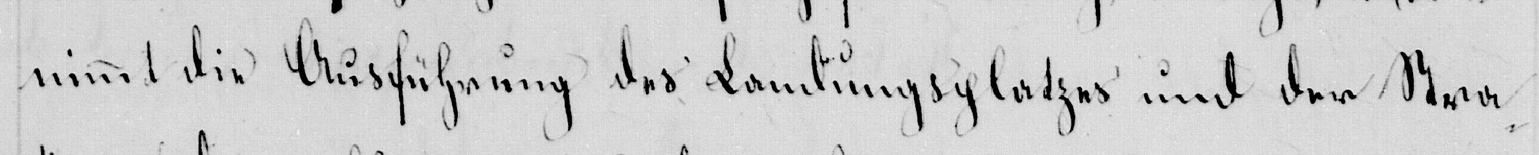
nimmt die Ausführung des Landungsplatzes und der Stra¬
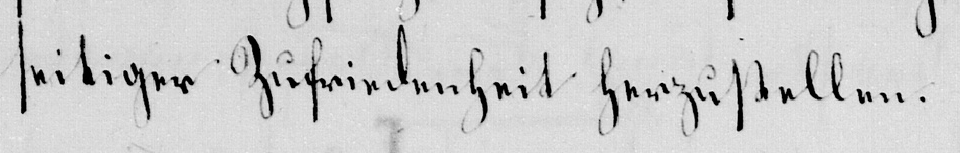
seitiger Zufriedenheit herzustellen.
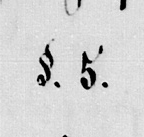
§. 5.
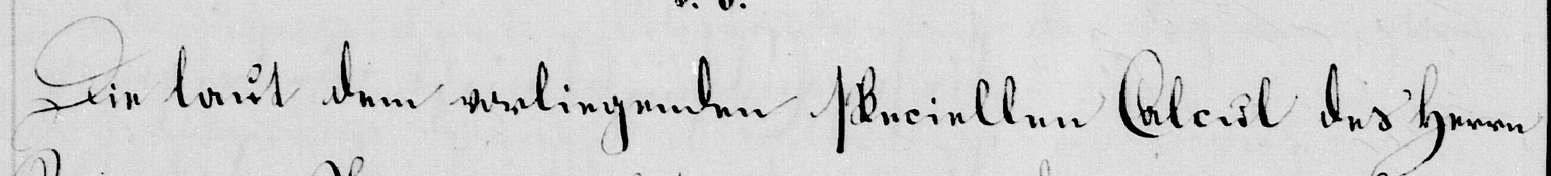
Die laut dem vorliegenden speciellen Calcul des Herrn
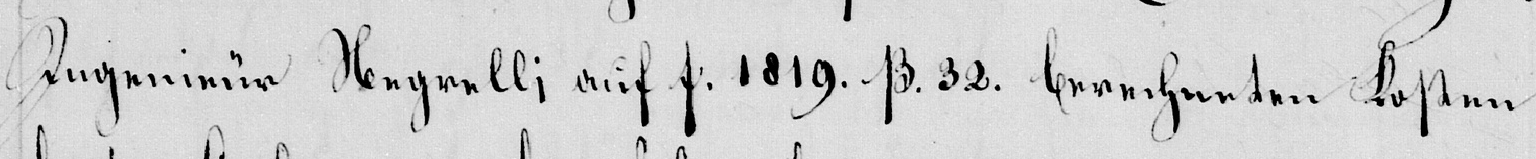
Ingenieur Negrelli auf f. 1819. ß. 32. berechneten Kosten
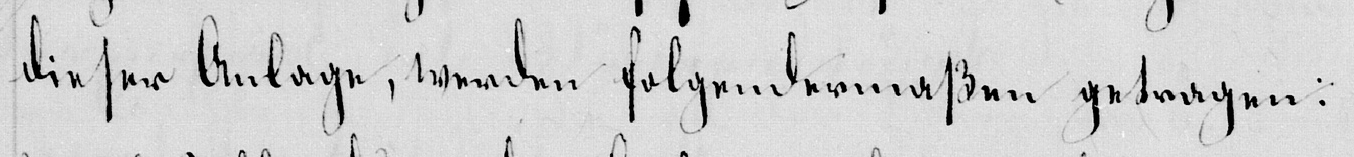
dieser Anlage, werden folgendermaßen getragen:
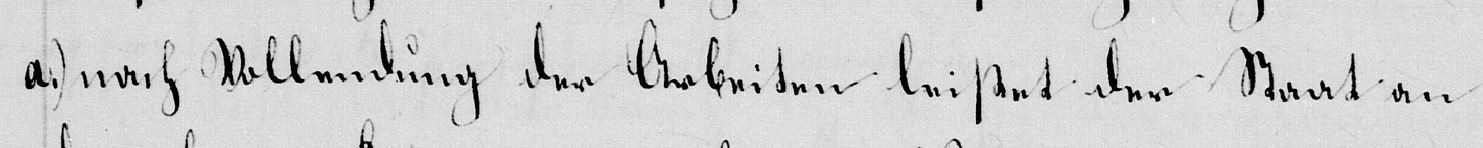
a.) nach Vollendung der Arbeiten leistet der Staat an
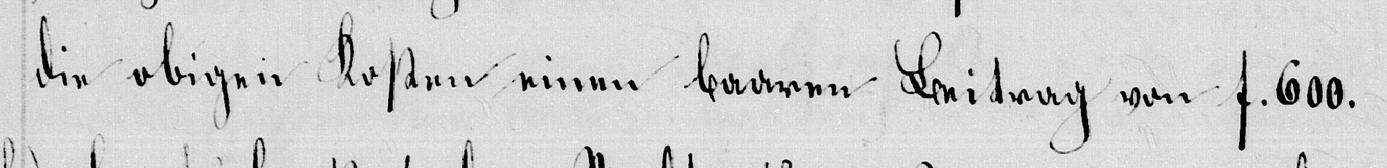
die obigen Kosten einen baaren Beitrag von f. 600.
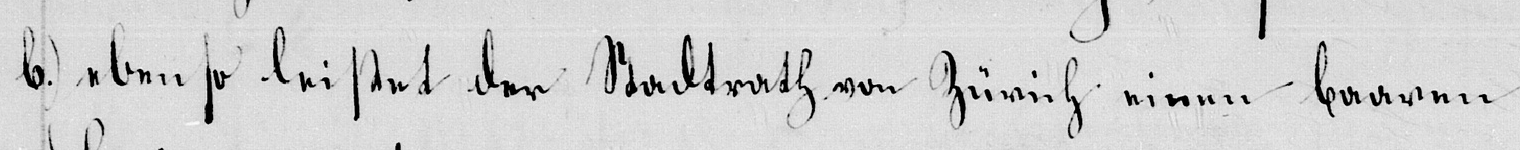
b.) ebenso leistet der Stadtrath von Zürich einen baaren
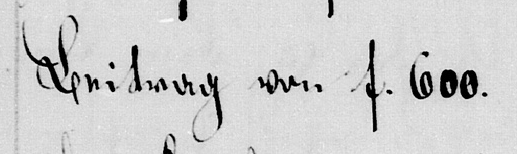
Beitrag von f. 600.
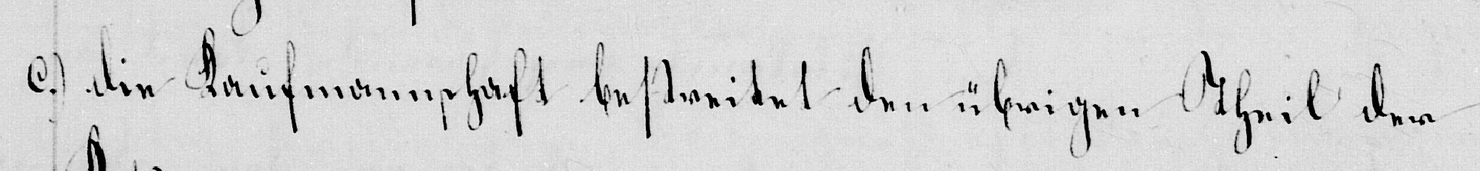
c.) Die Kaufmannschaft bestreitet den übrigen Theil der
